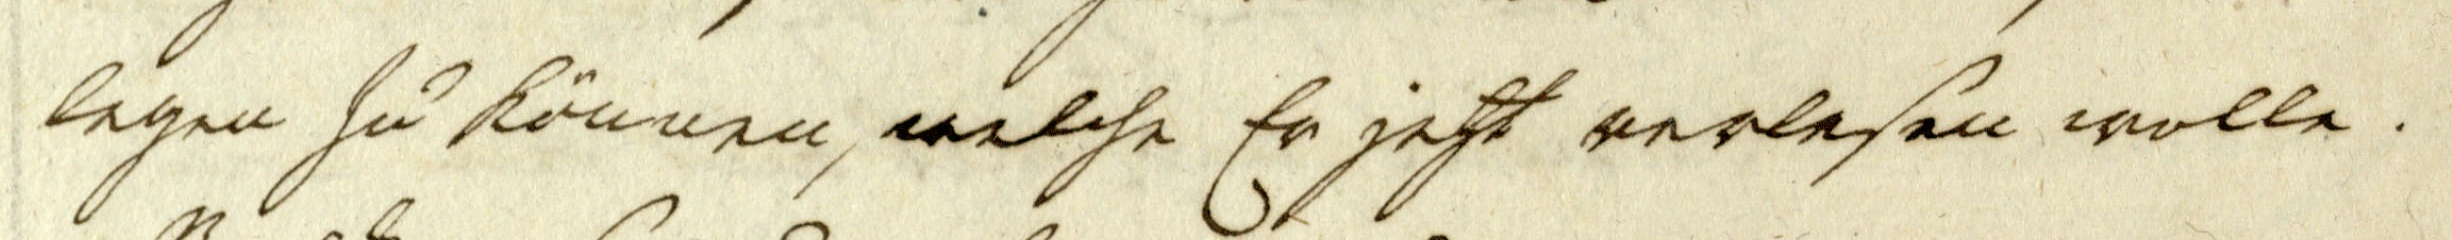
legen zu können, welche Er jetzt verlesen wolle.
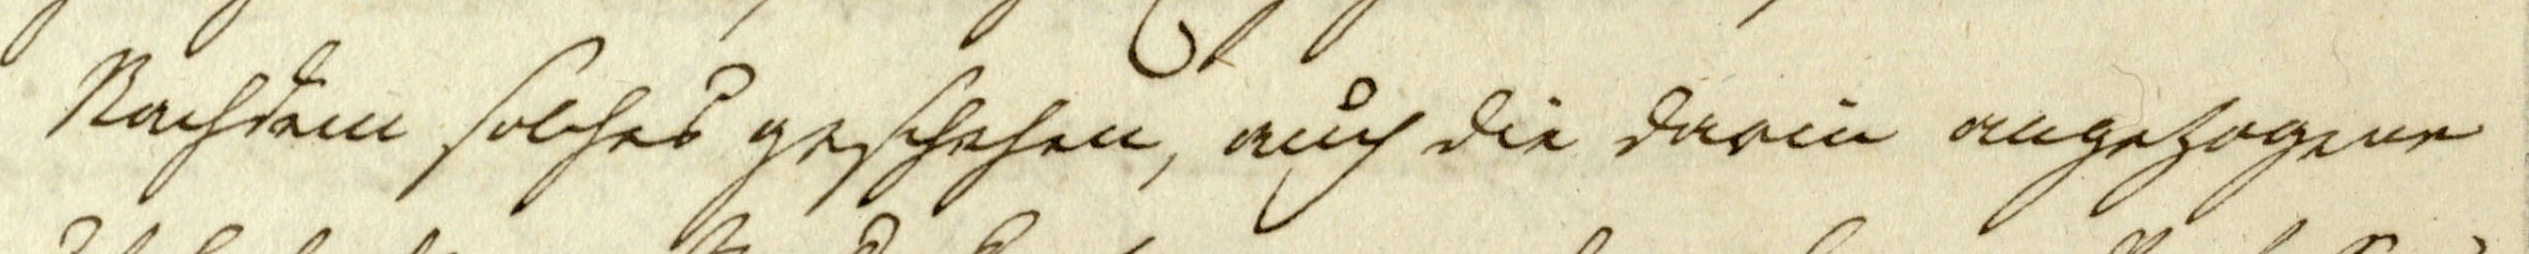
Nachdem solches geschehen, auch die darin angezogene
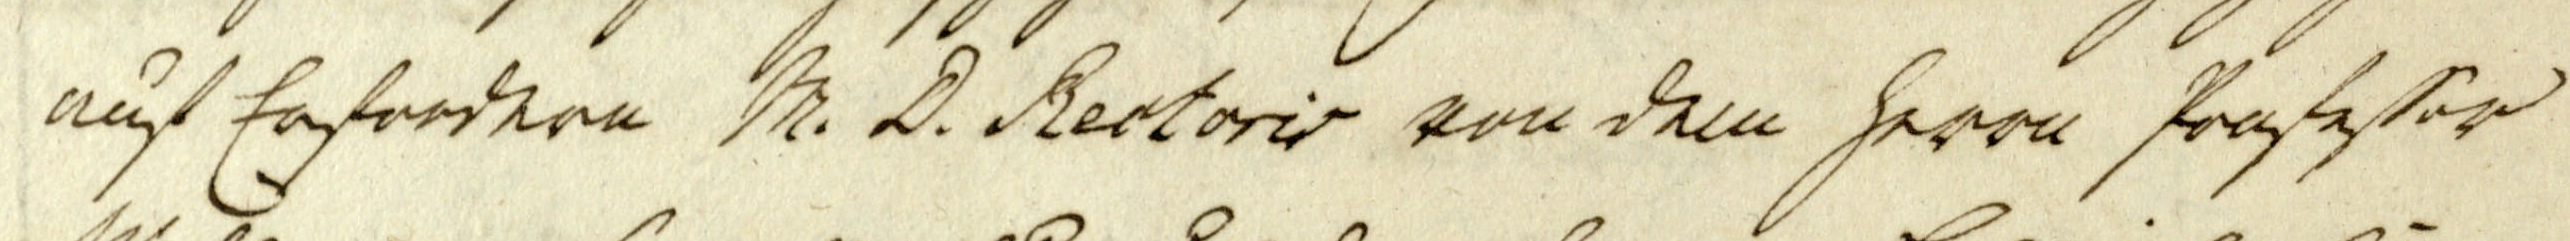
auf Erfordern M. D. Rectoris von dem herrn Professor
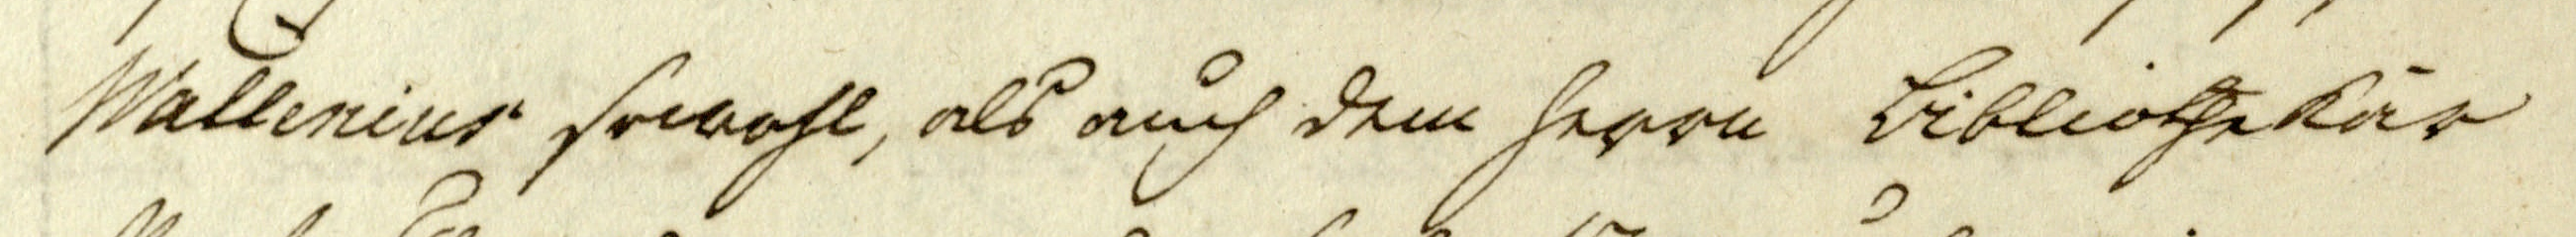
Wallenius sowohl als auch dem herrn Bibliothekar
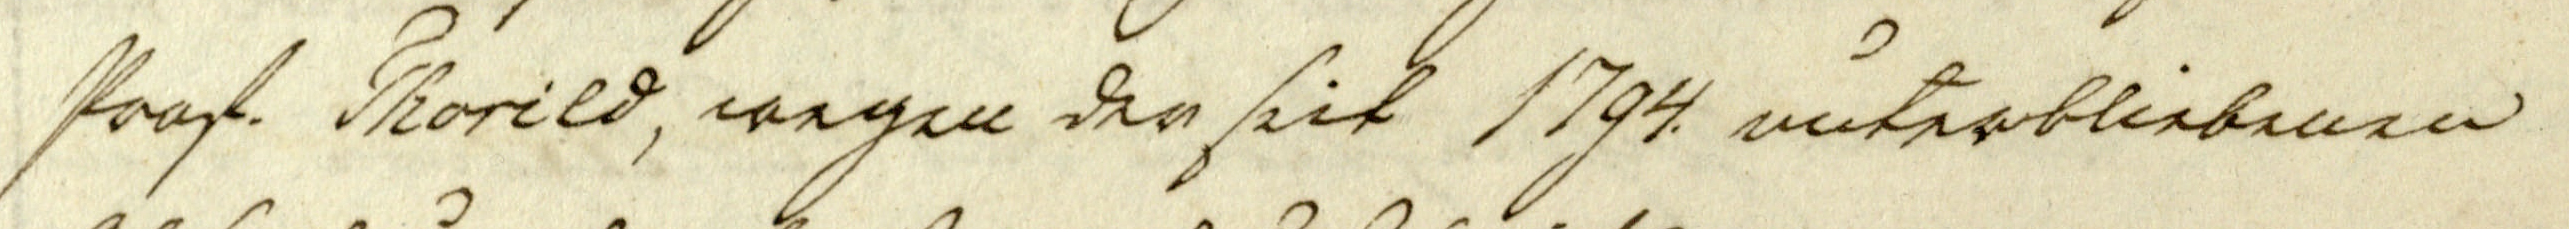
Prof. Thorild, wegen der seit 1794 unterbliebenen
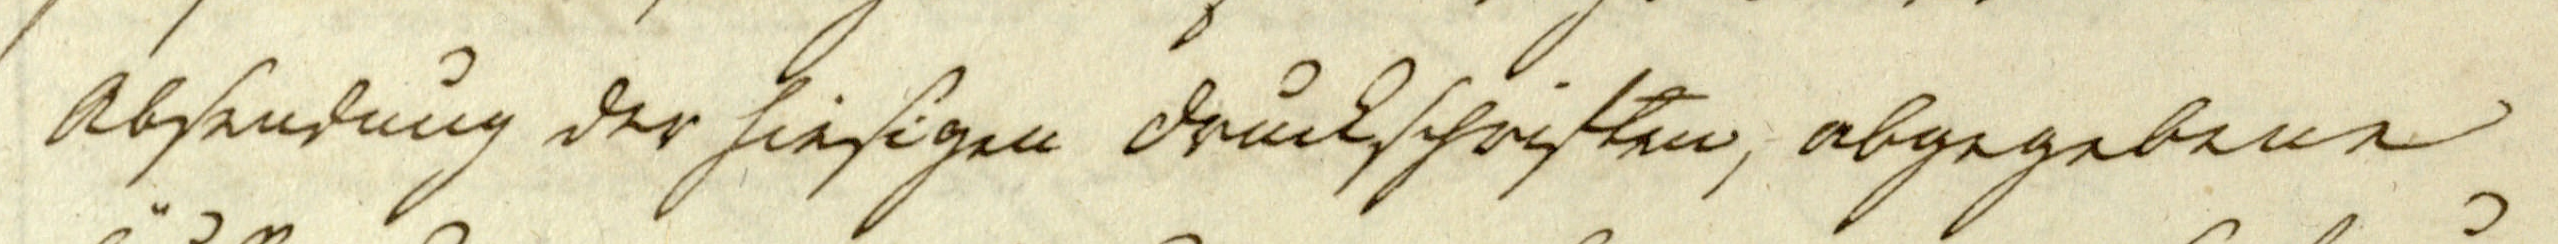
Absendung der hiesigen Druckschriften, abgegebene
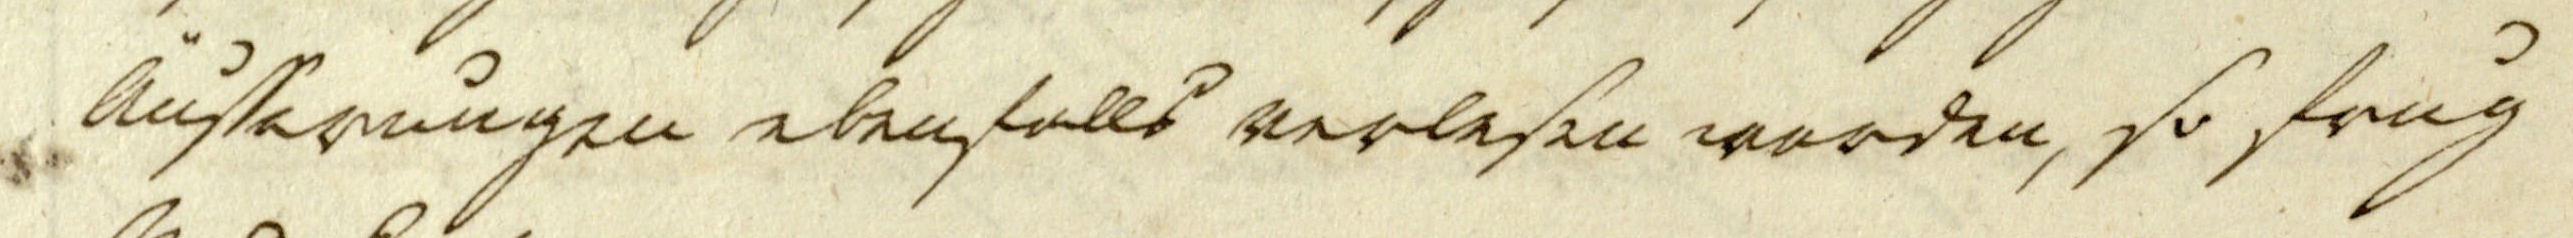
Äusserungen ebenfalls verlesen worden, so frug
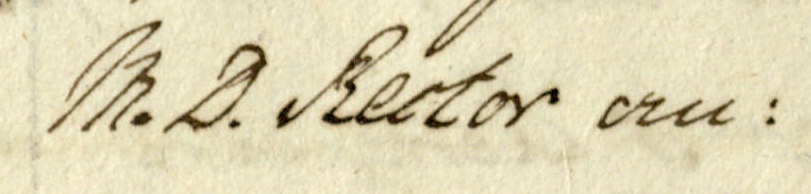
M. D. Rector an:
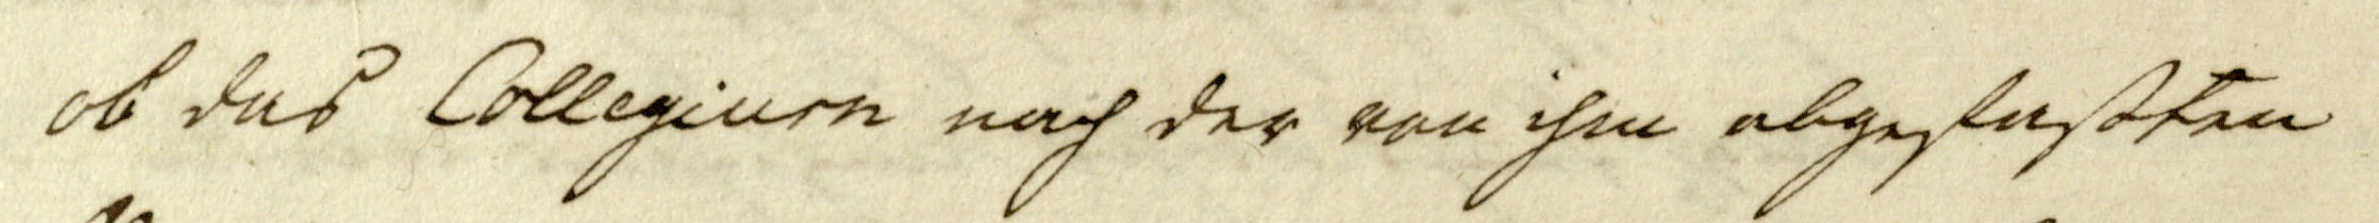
ob das Collegium nach der von ihm abgefaßten
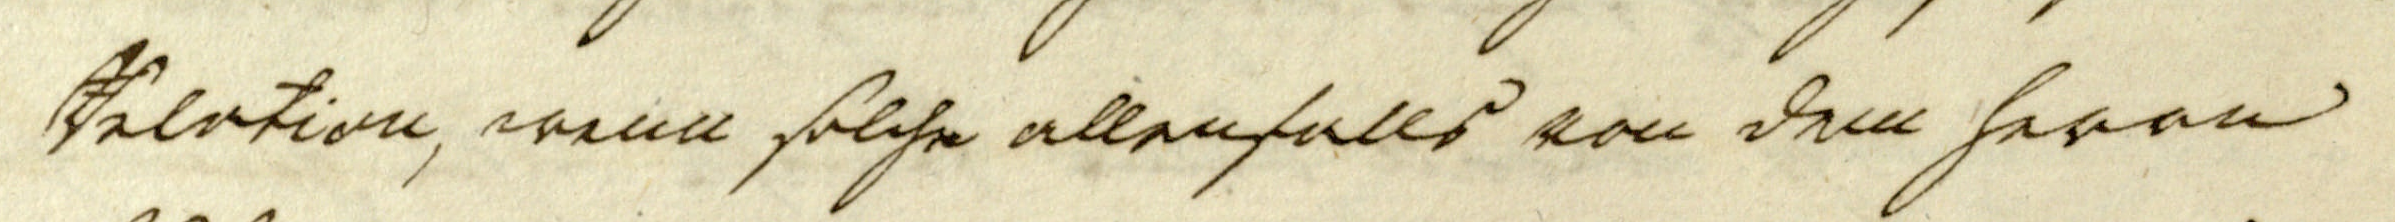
Relation, wenn solche allenfalls von dem herrn
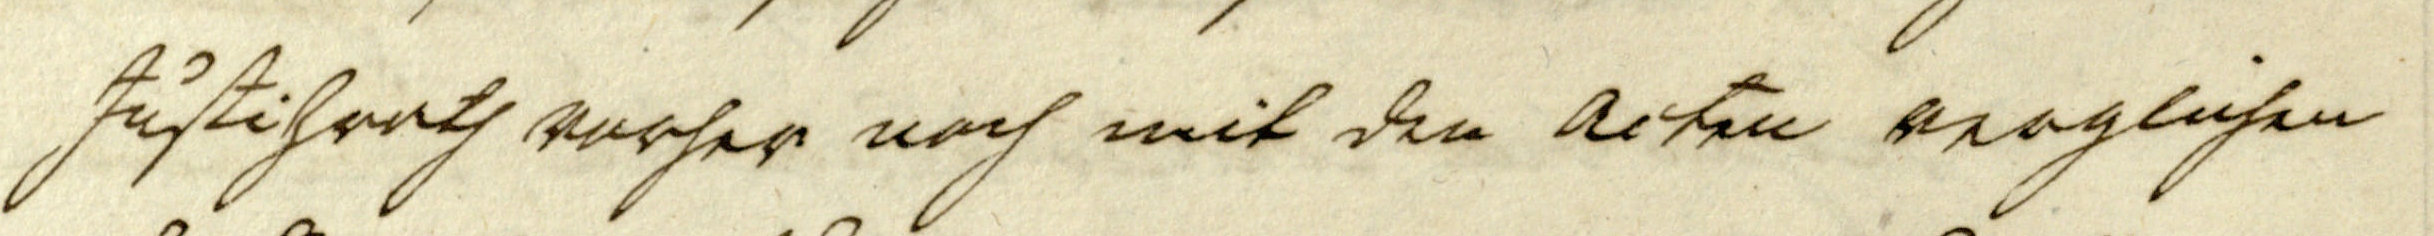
Justizrath vorher noch mit den Acten verglichen
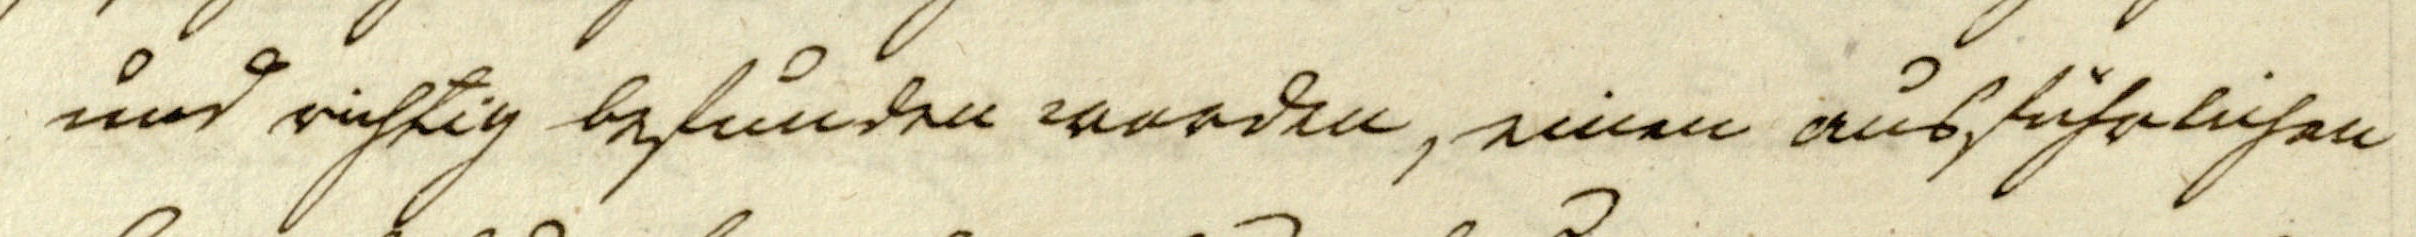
und richtig befunden worden, einen ausführlichen
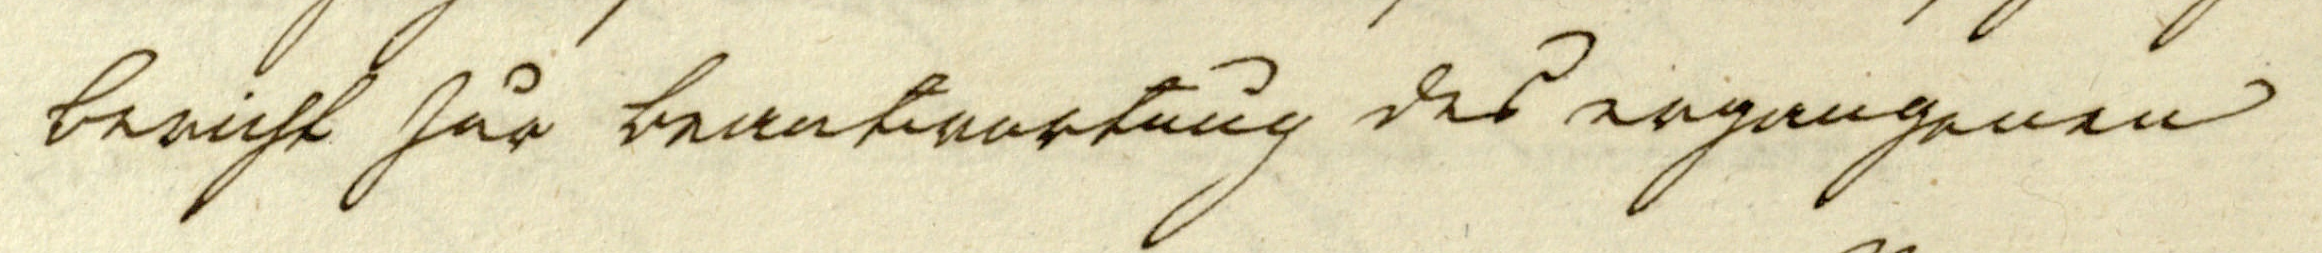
Bericht zur Beantwortung des ergangenen
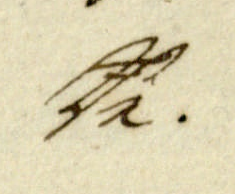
Re
